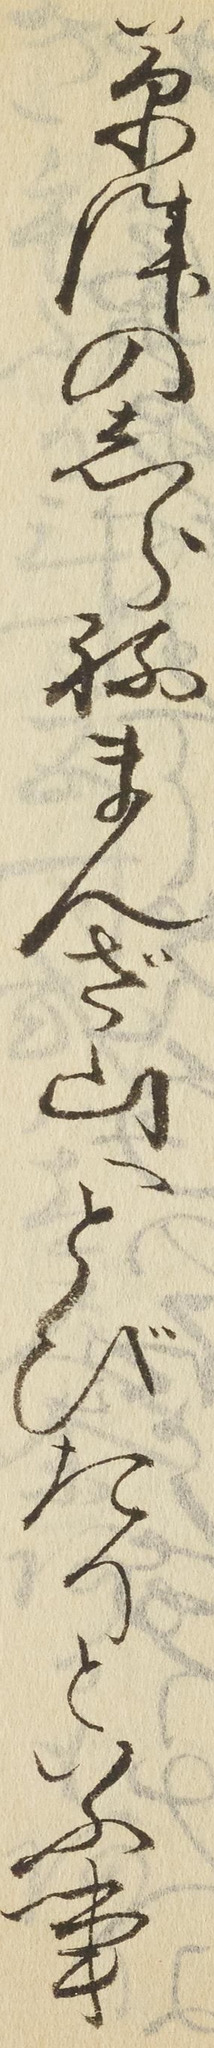草津のしらねまんざ山へとひたりといふ事
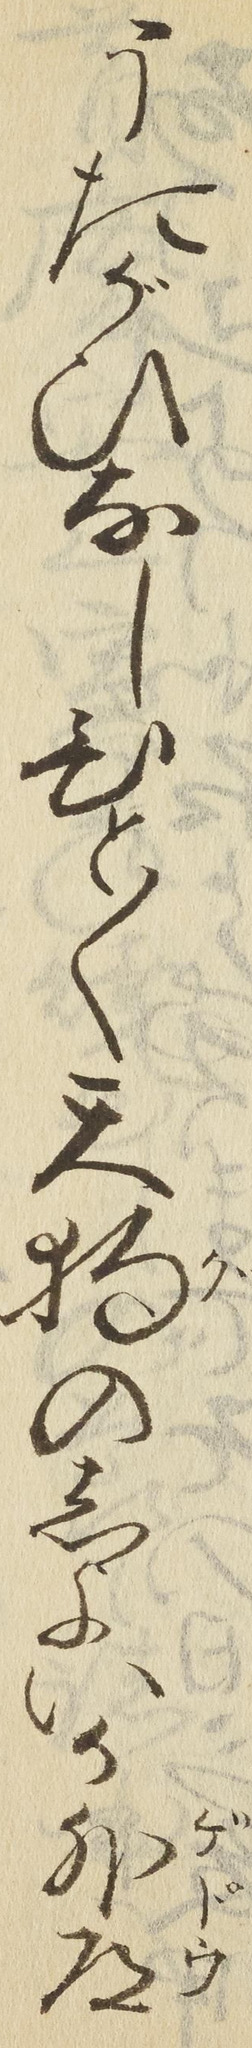うたかひなしひと〳〵天狗のしよいか外道
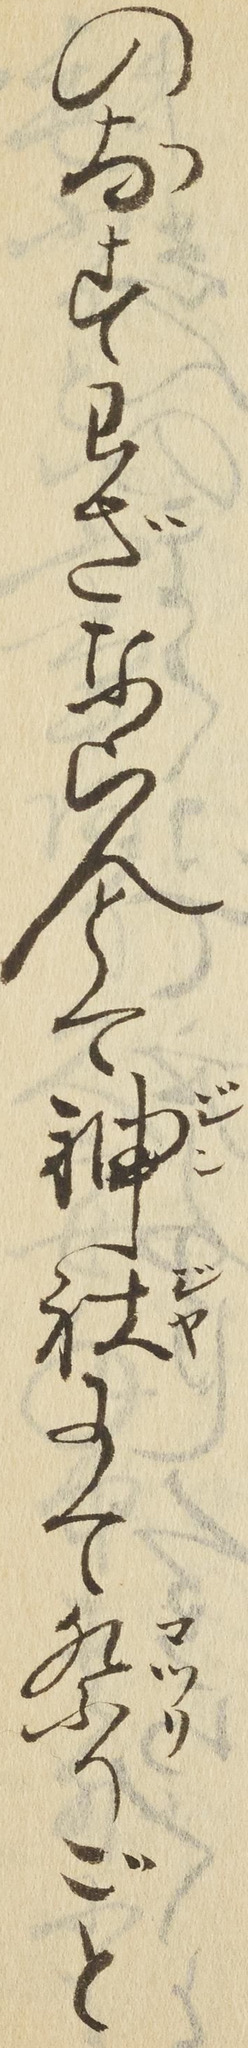のなすわざならんとて神社にて祭りごと
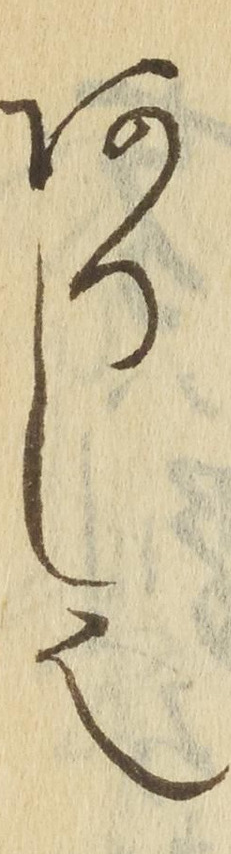ありし也
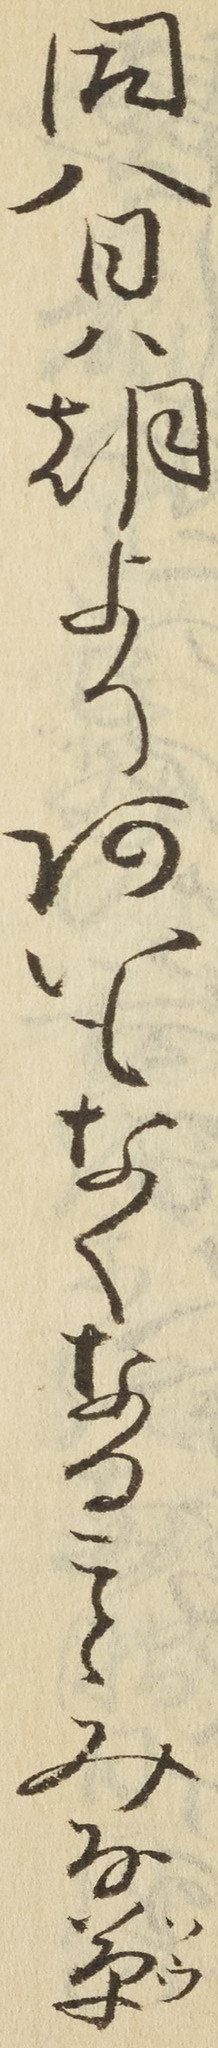同八日は朝より何もなくなることみな草
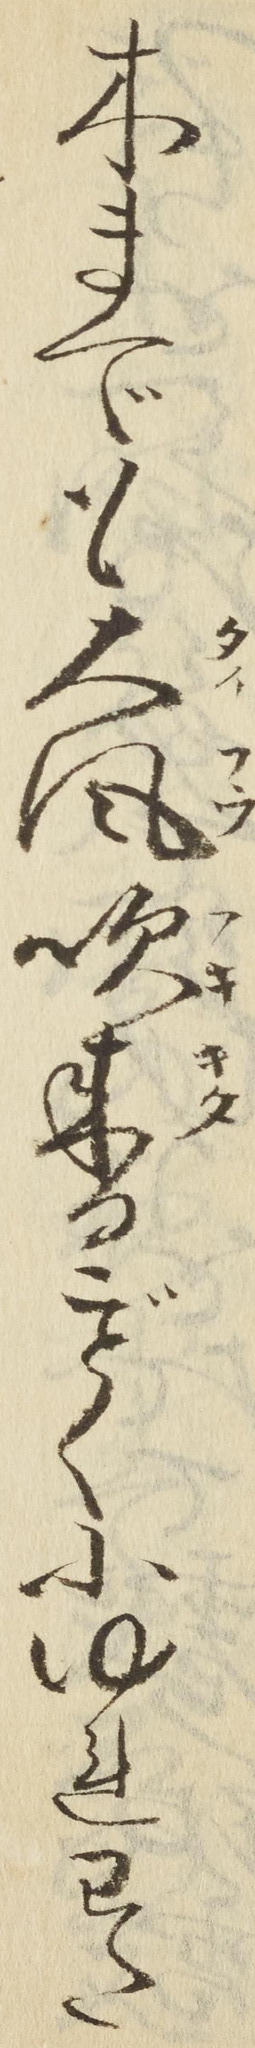木までも大風吹来るごとくにゆれわた
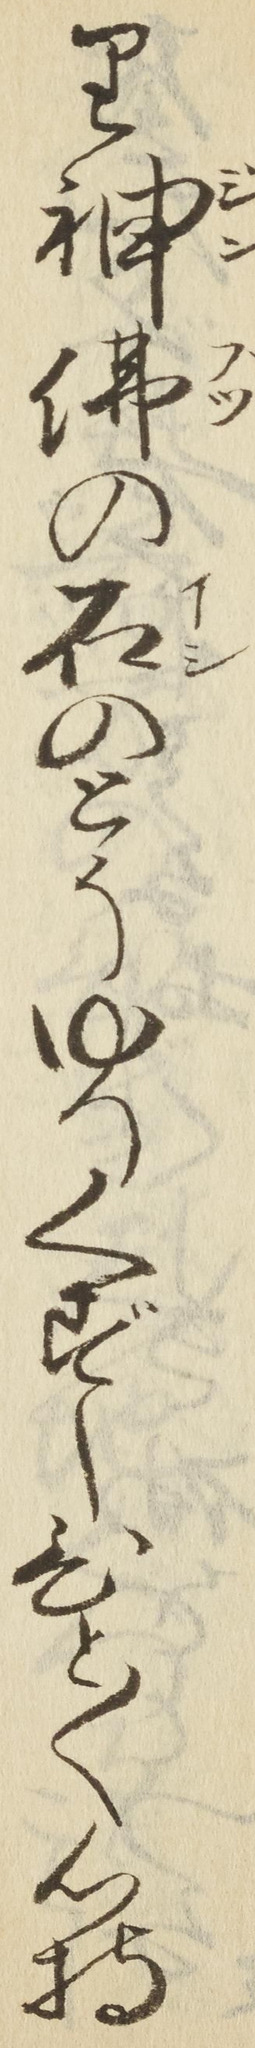り神仏の石のとうゆりくすしひと〳〵心持
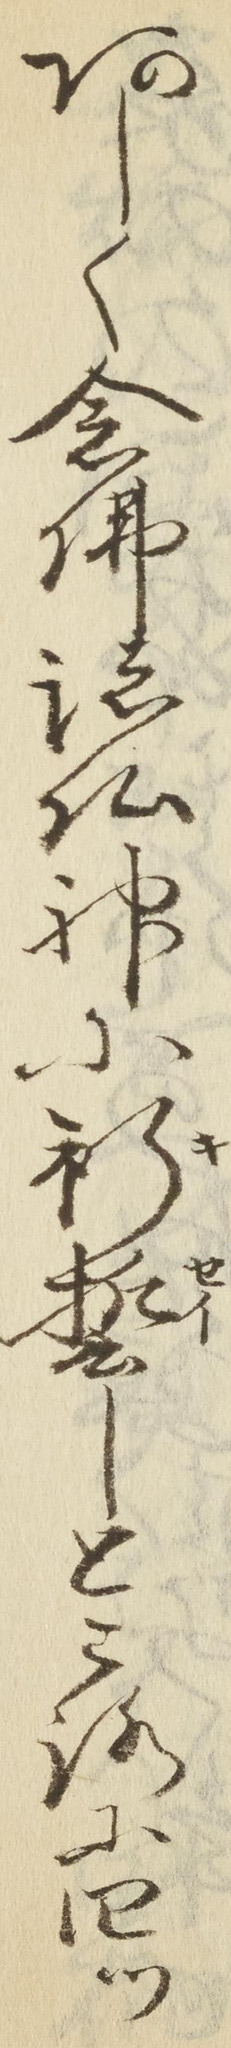あしく念仏諸仏神に祈誓しとところに四ッ
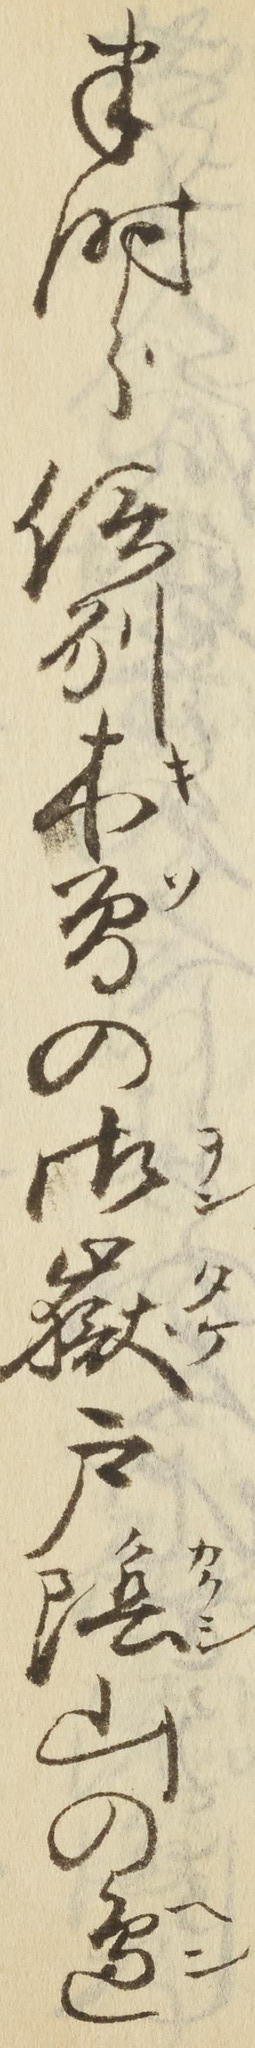半時分信州木曽の御嶽戸隠山の辺
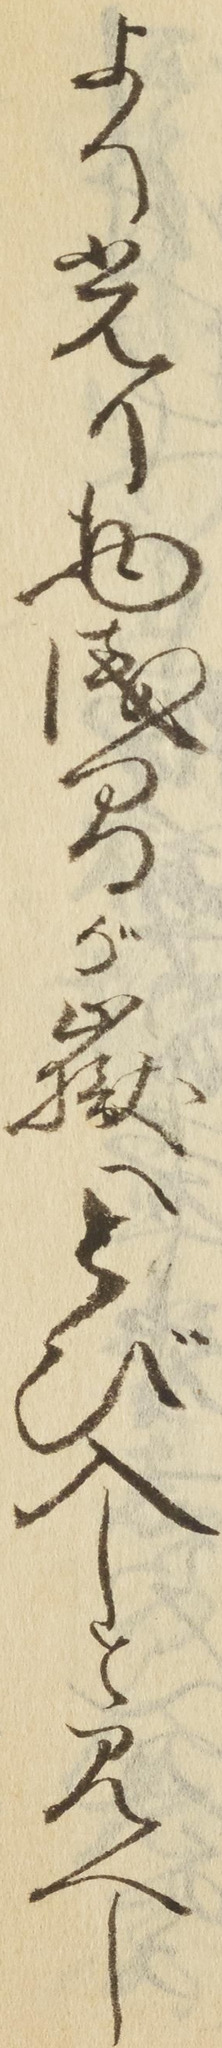より光り物浅間が嶽へとび入しと見へし
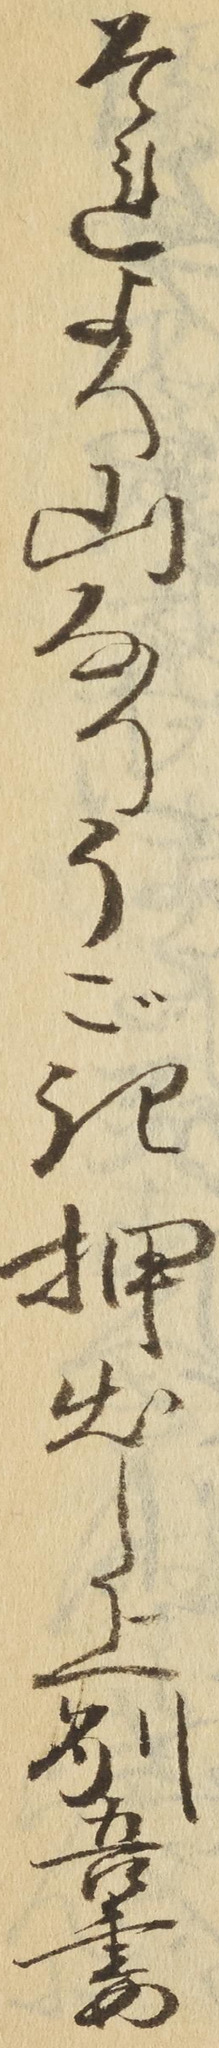それより山なりうごき押出し上州吾妻

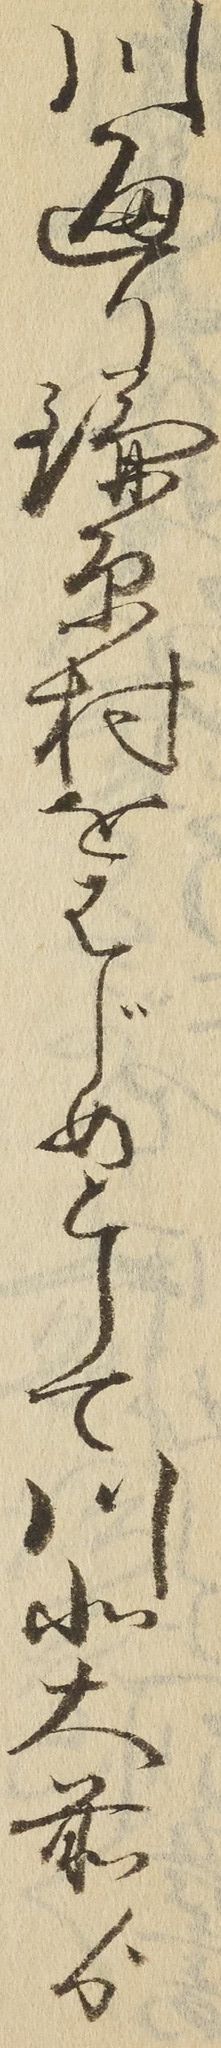川通り鎌原村をはじまとして川北大前ゟ
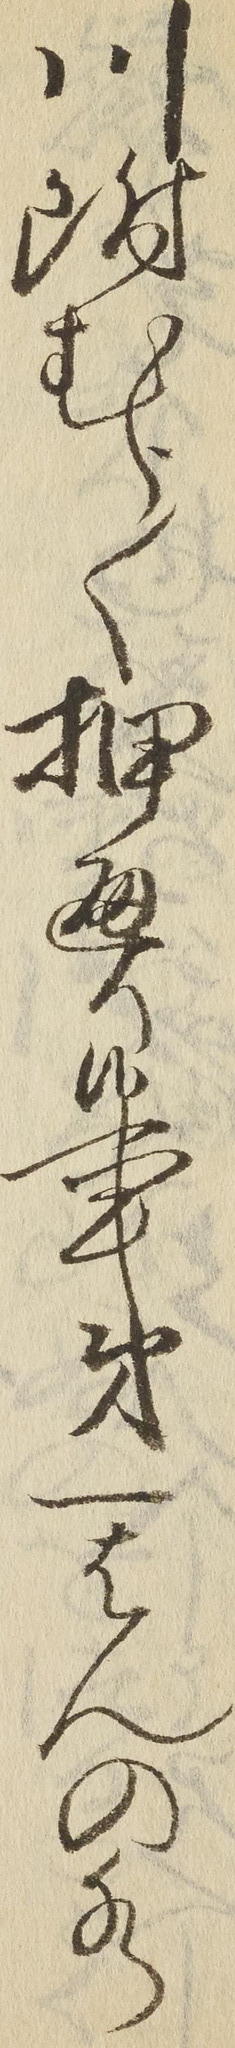川附むら〳〵押廻り候事第一はんの水
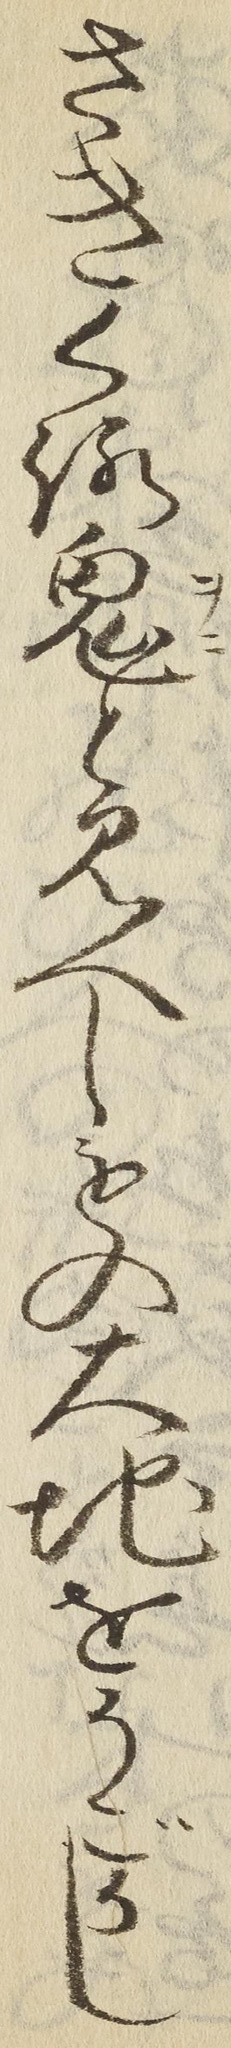さきくろ鬼と見へしもの大地をうごかし
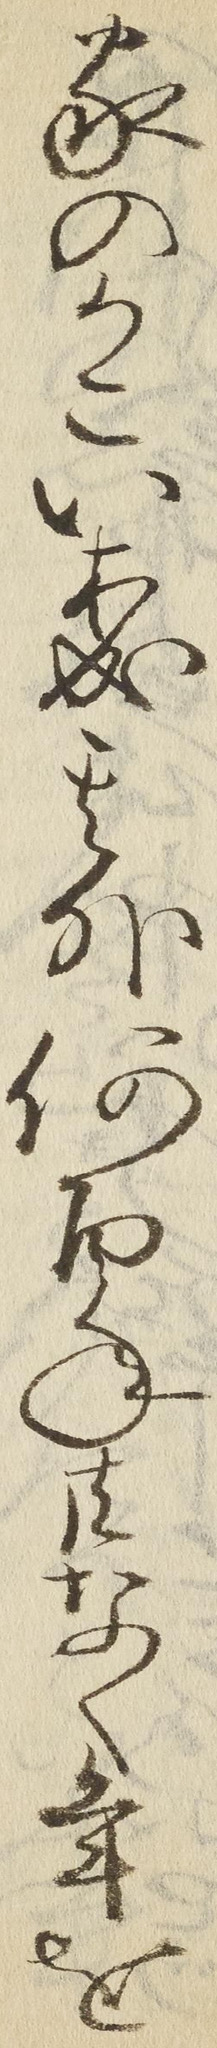家のかこい森其外何百年共なく年を
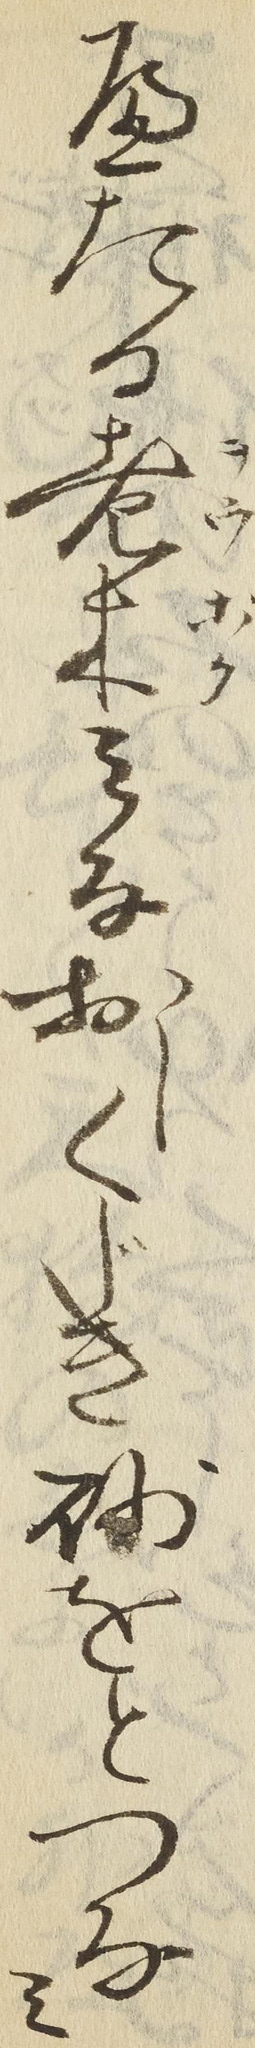へたる老木みなおしくしき砂をとつなみ
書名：浅間大變記
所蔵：東京大学地震研究所図書室 Earthquake Research Institute Library, The University of Tokyo, JAPAN
